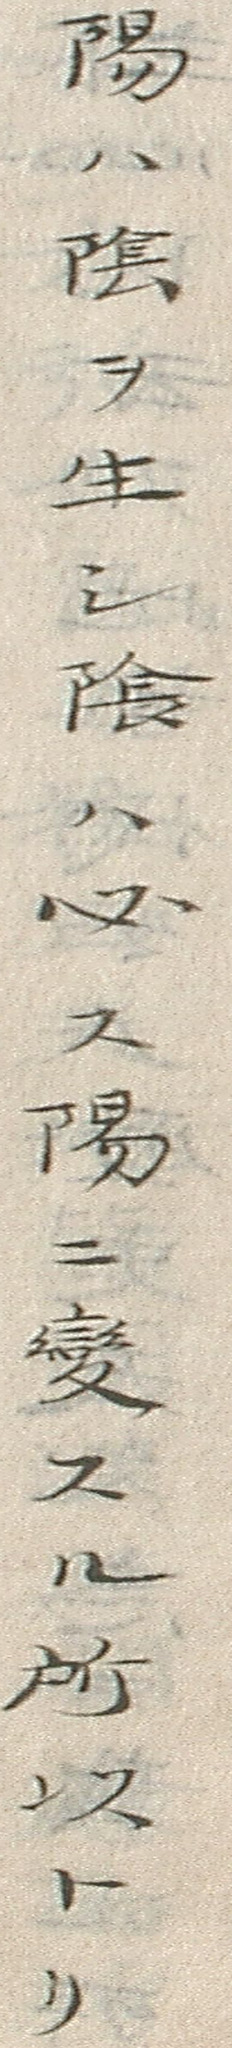陽ハ陰ヲ生シ陰ハ必ス陽ニ変スル所以トリ
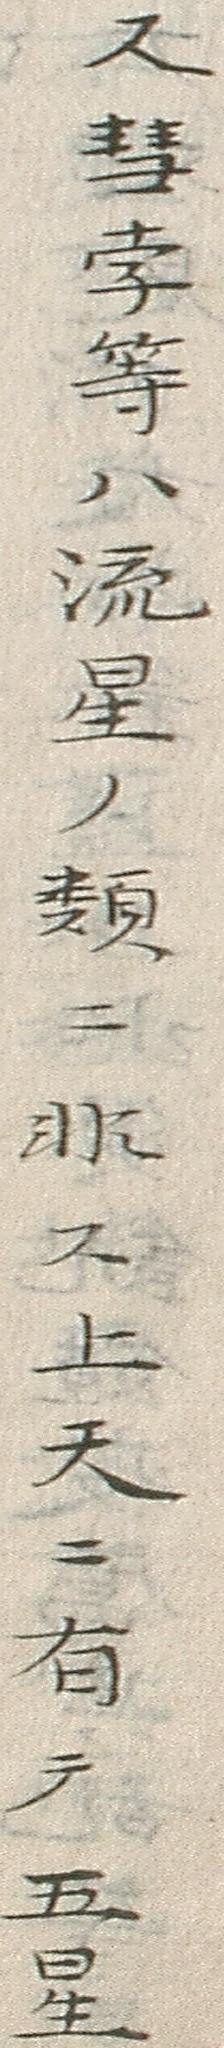又彗孛等ハ流星ノ類ニ非ス上天ニ有テ五星
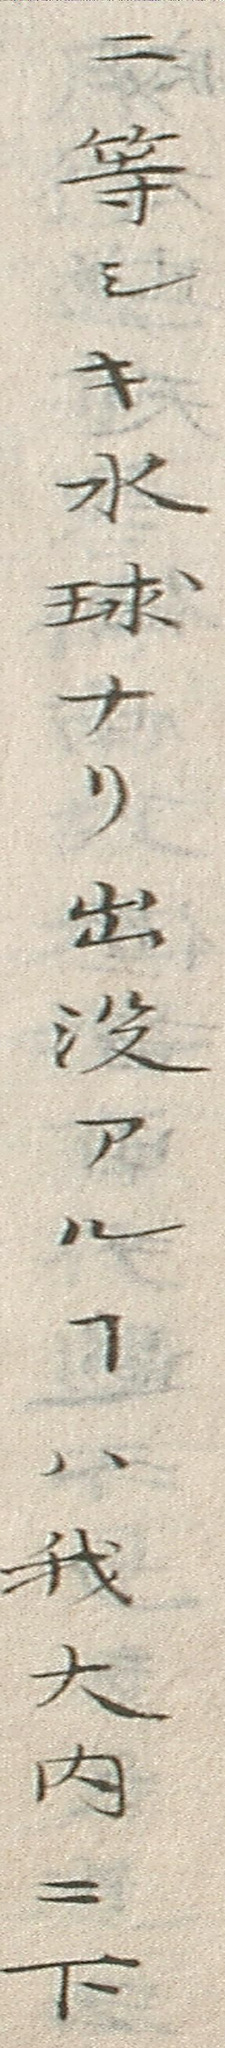ニ等シキ水球ナリ出没アルコトハ我大内ニ下
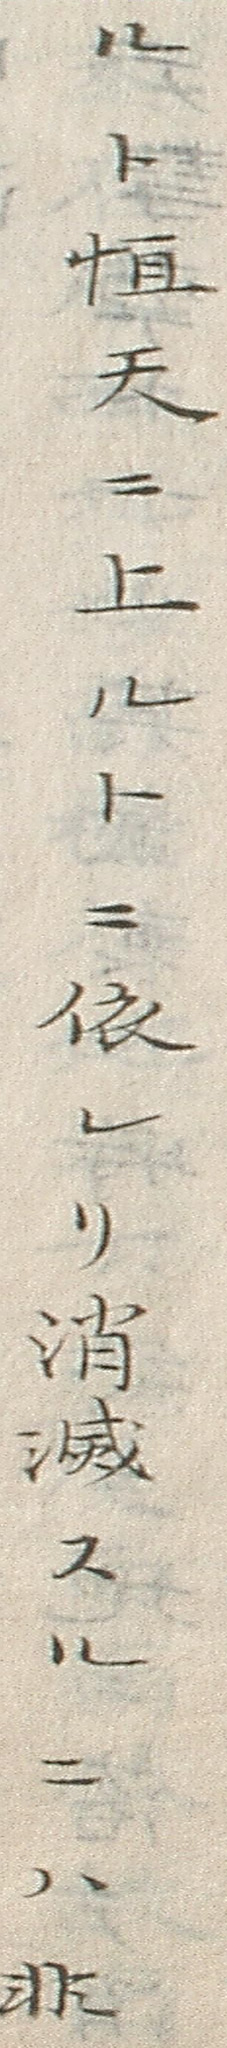ルト恒天ニ上ルトニ依レリ消滅スルニハ非
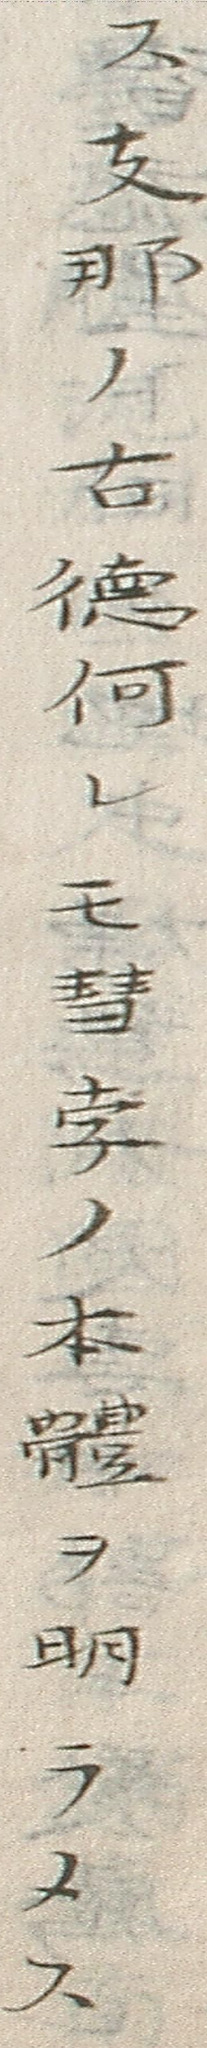ス支那ノ古徳何レモ彗孛ノ本体ヲ明ラメス

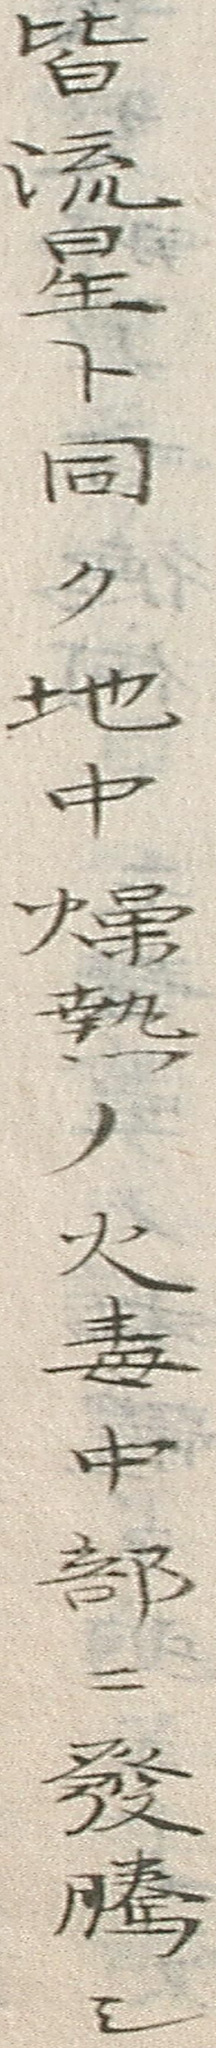皆流星ト同ク地中燥熱ノ火毒中部ニ発騰シ
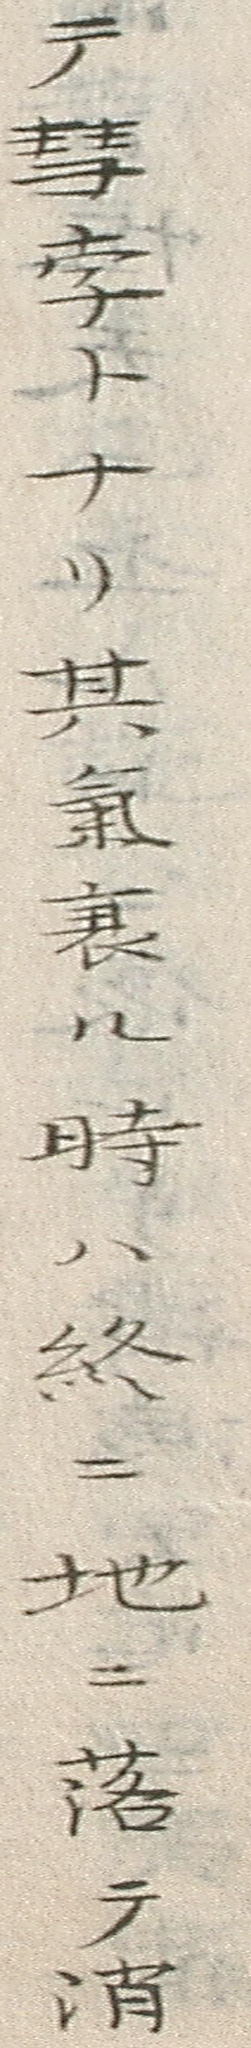テ彗孛トナリ其気？ル時ハ終ニ地ニ落テ消
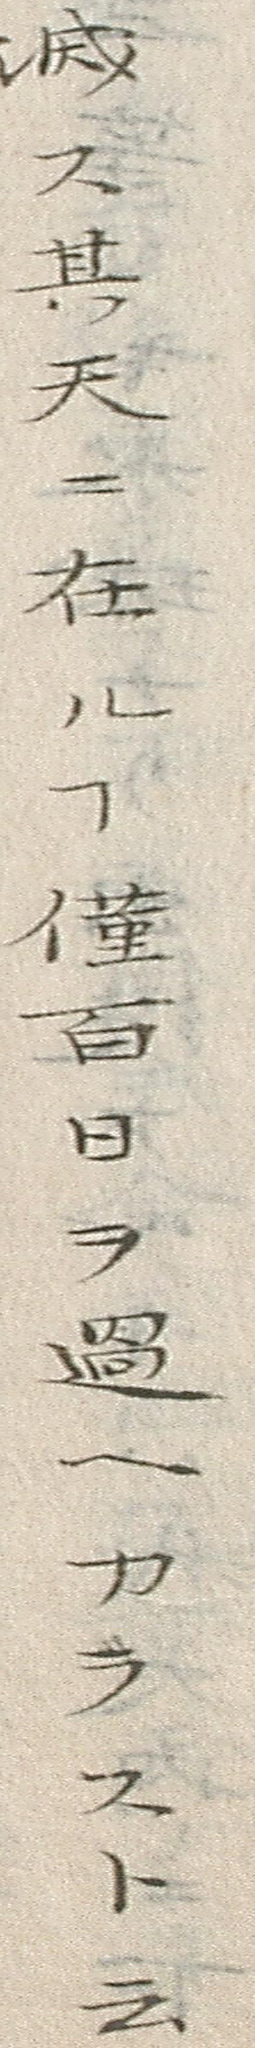滅ス其天ニ在ルコト僅百日ヲ過ヘカラスト云
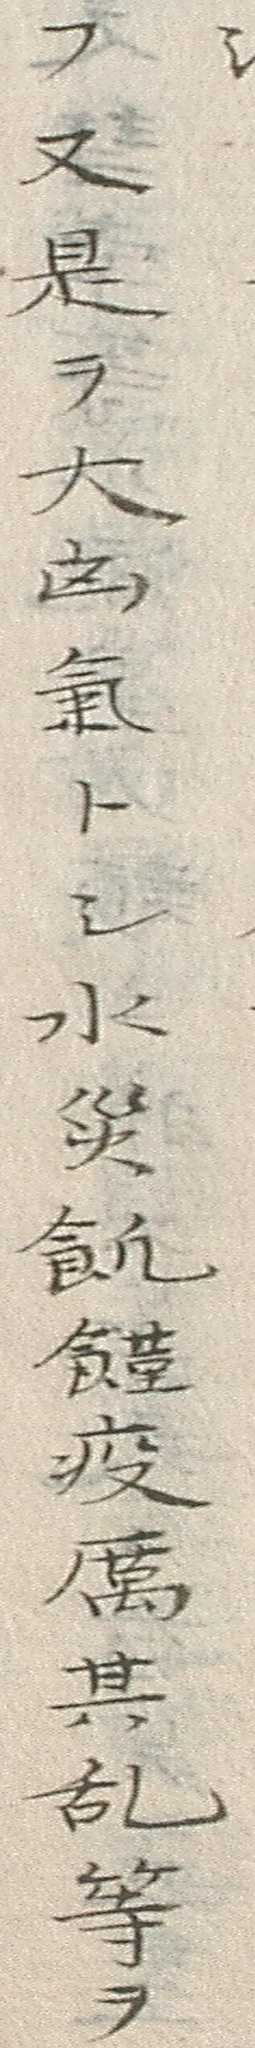フ又是ヲ大凶気トシ水災飢饉疫厲其乱等ヲ
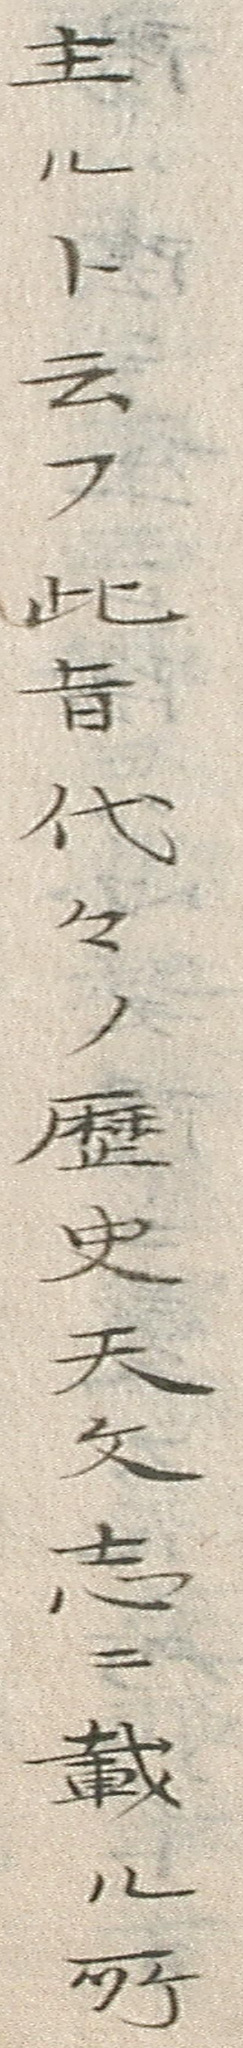主ルト云フ此旨代々ノ歴史天文志ニ載ル所
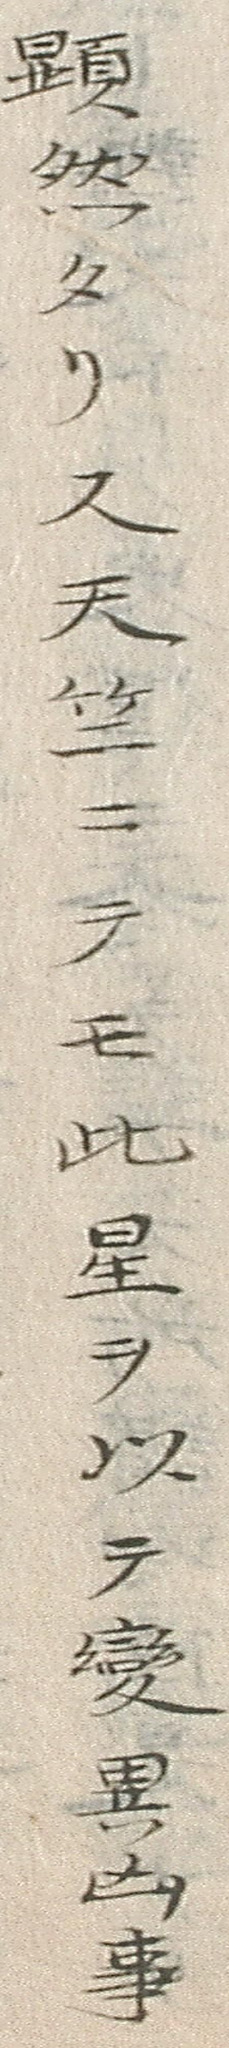顕然タリ又天竺ニテモ此星ヲ以変異凶事
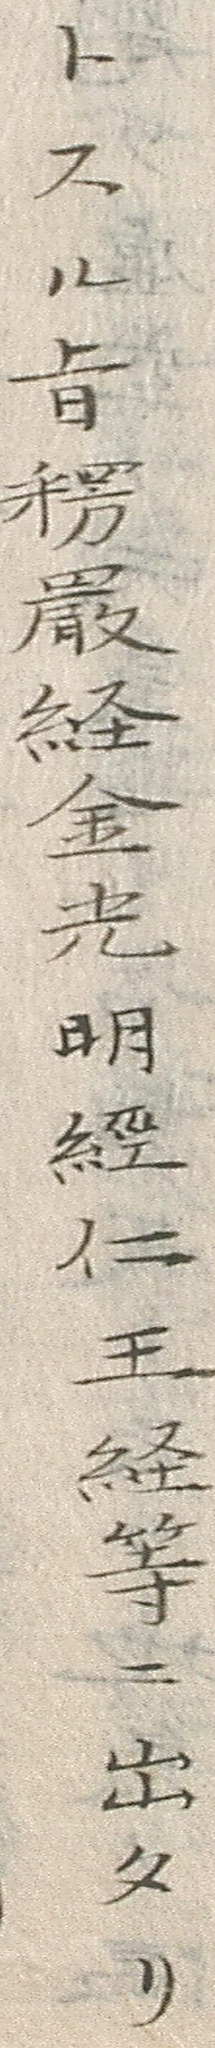トスル旨？厳経金光明経仁王経等ニ出タリ
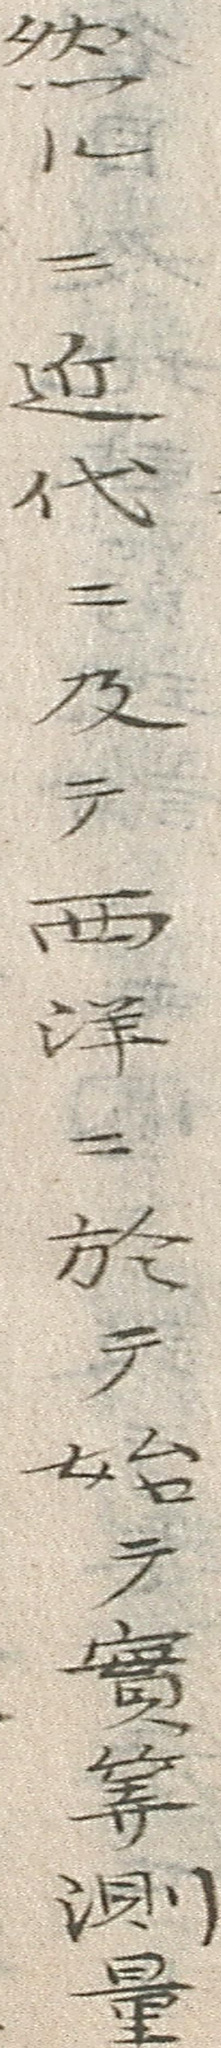然ルニ近代ニ及テ西洋ニ於テ始テ実等測量
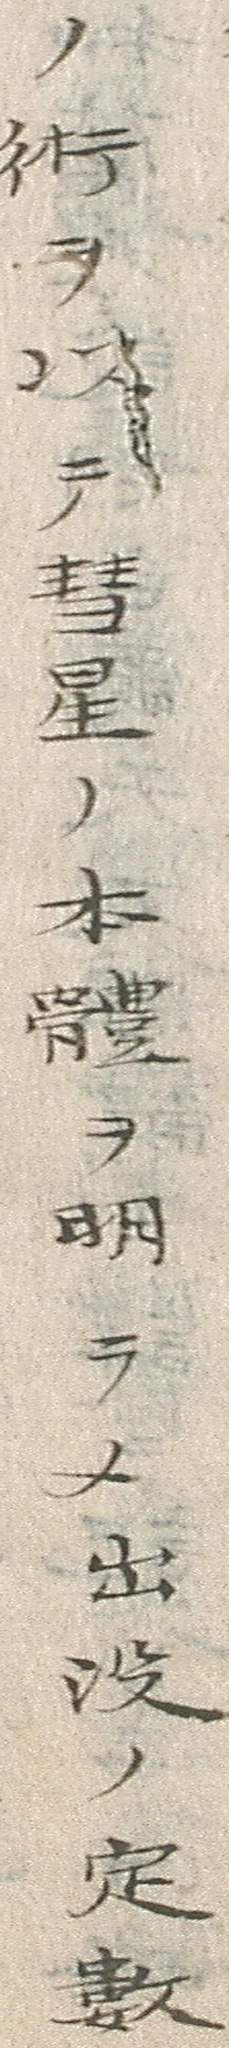ノ術ヲ以テ彗星ノ本体ヲ明ラメ出没ノ定数
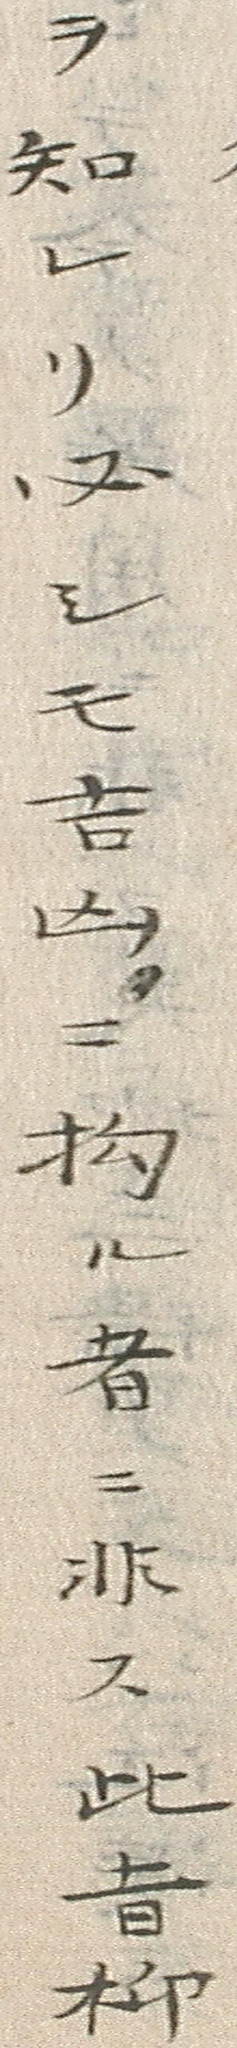ヲ知レリ必シモ吉凶ニ拘ル者ニ非ス此旨柳
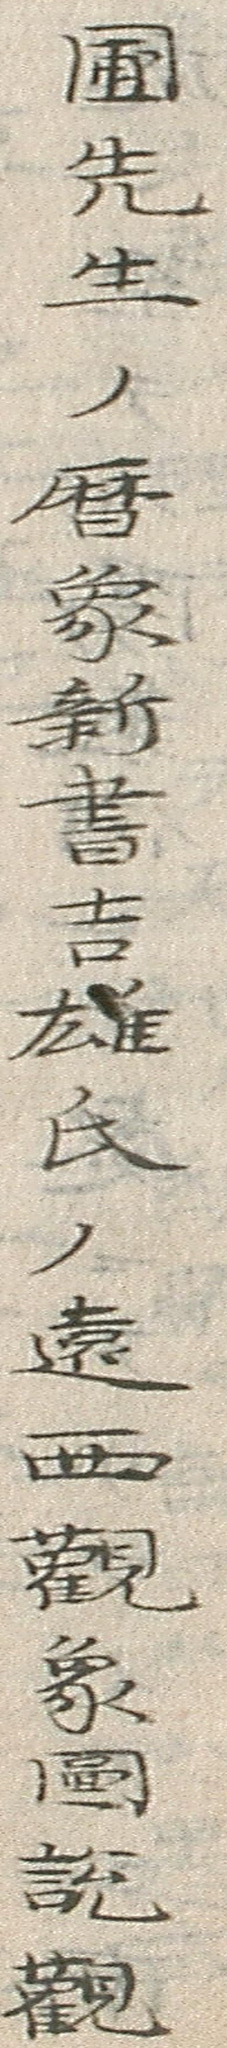圃先生ノ暦象新書吉雄氏ノ遠西観象図説観
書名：天學略名目羽翼　全
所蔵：東京大学地震研究所図書室 Earthquake Research Institute Library, The University of Tokyo, JAPAN
